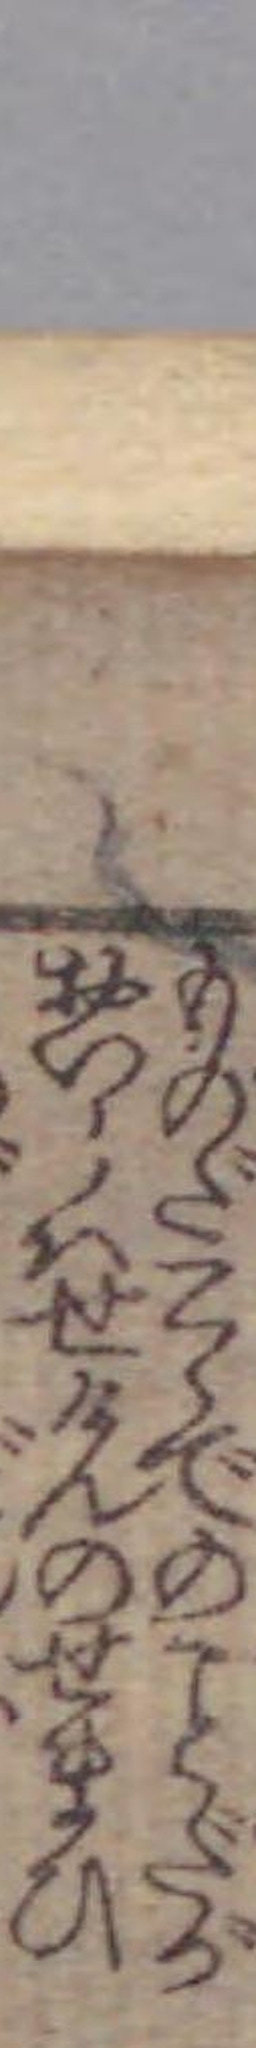おいらはせけんのせまひ
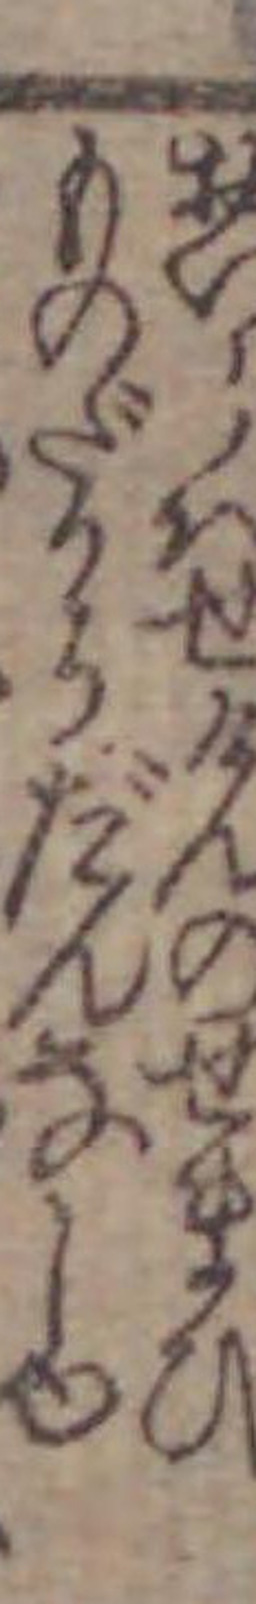ものだからだんなしゆ
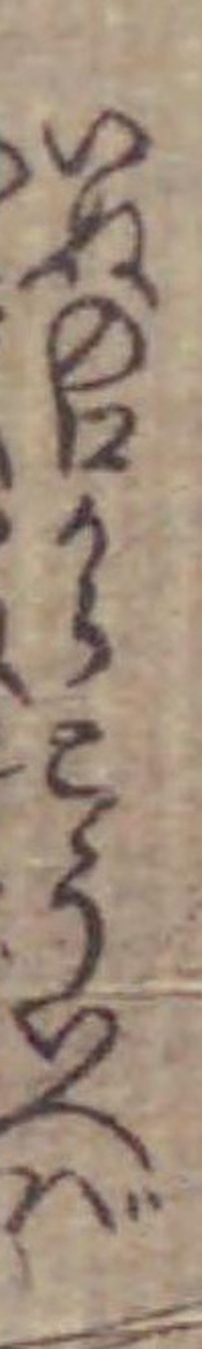いぬの口からこういへば
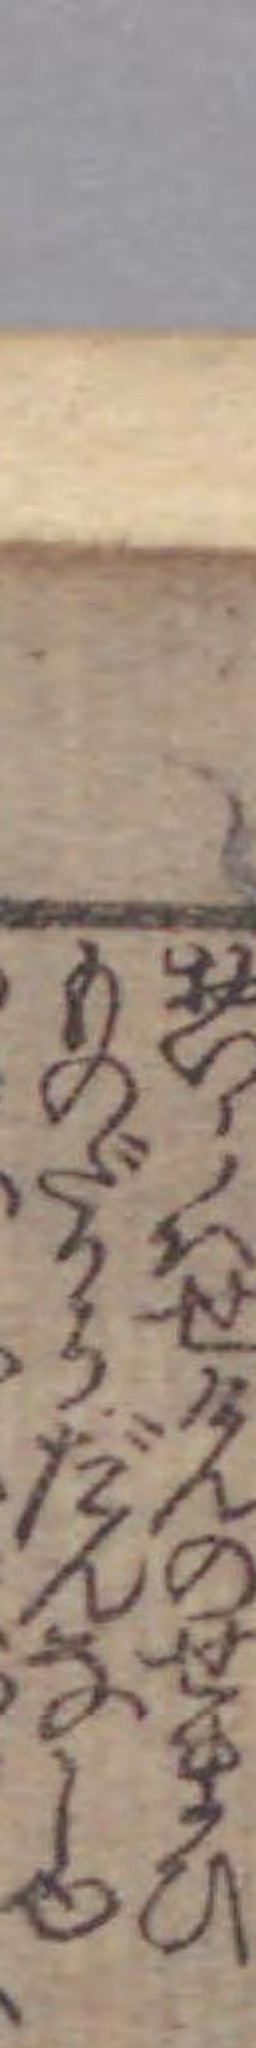ものだからだんなしゆ
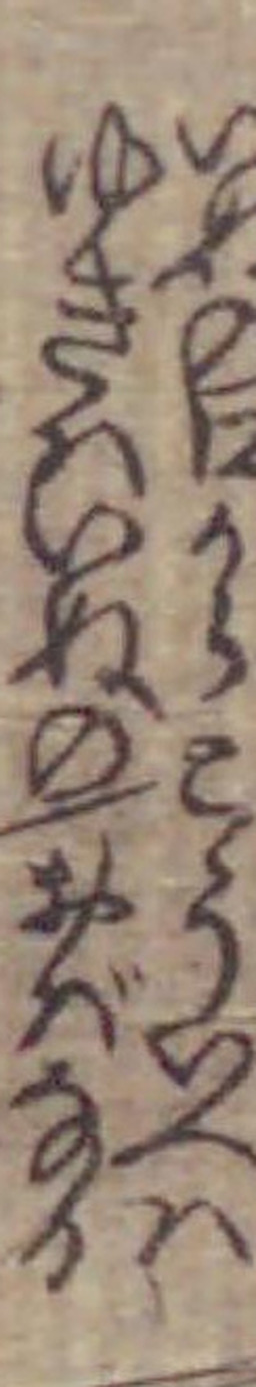ゆきはいぬのおばなる
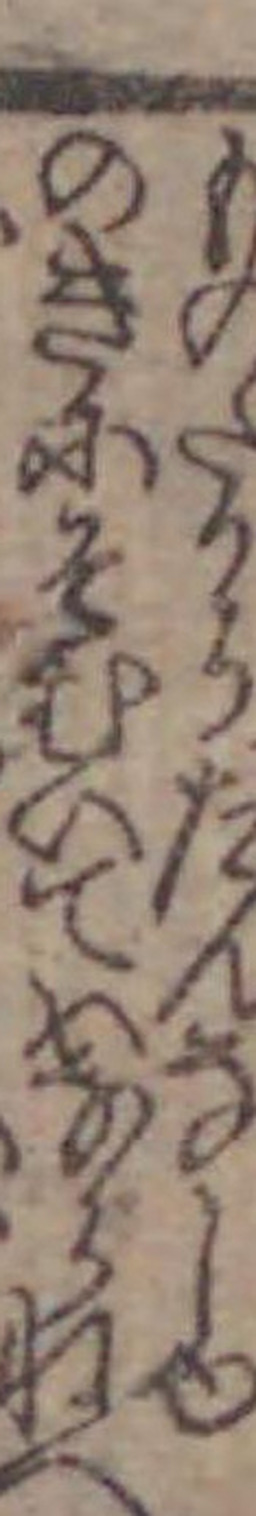のきにそむいてはならねへ
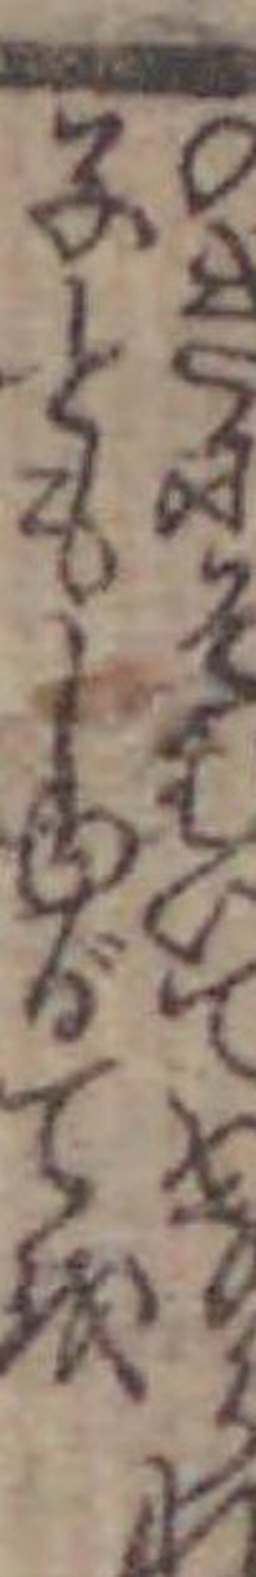子ともしゆがてを
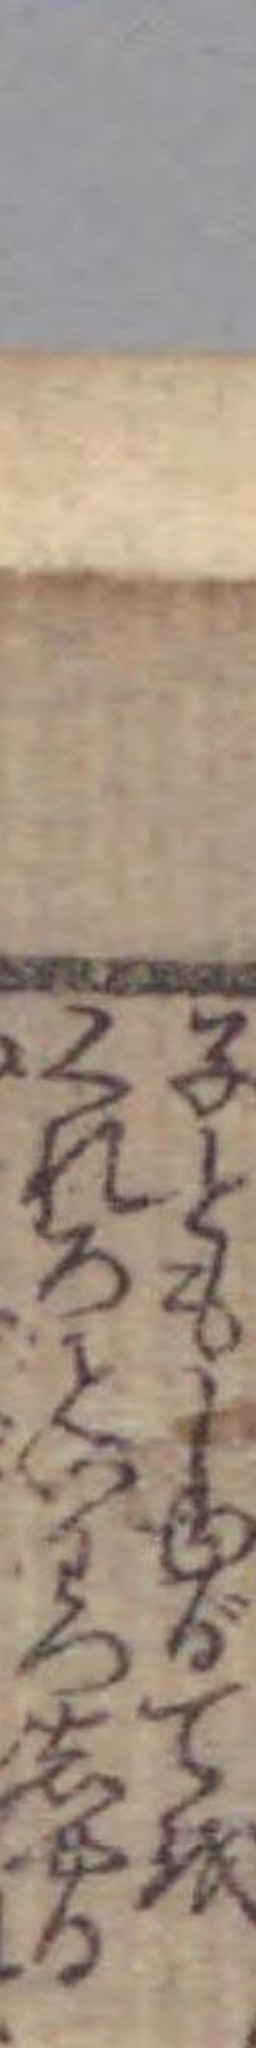くれろといわつしやる
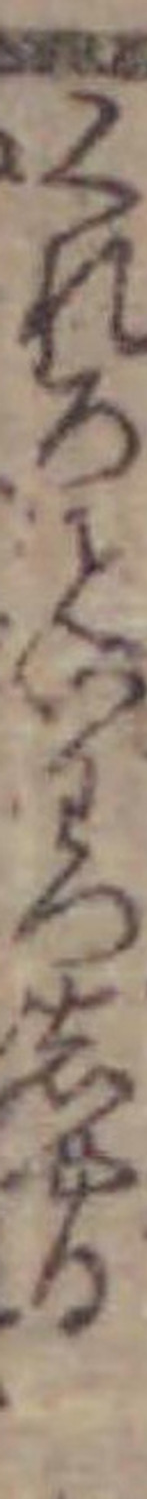くれろといわつしやる
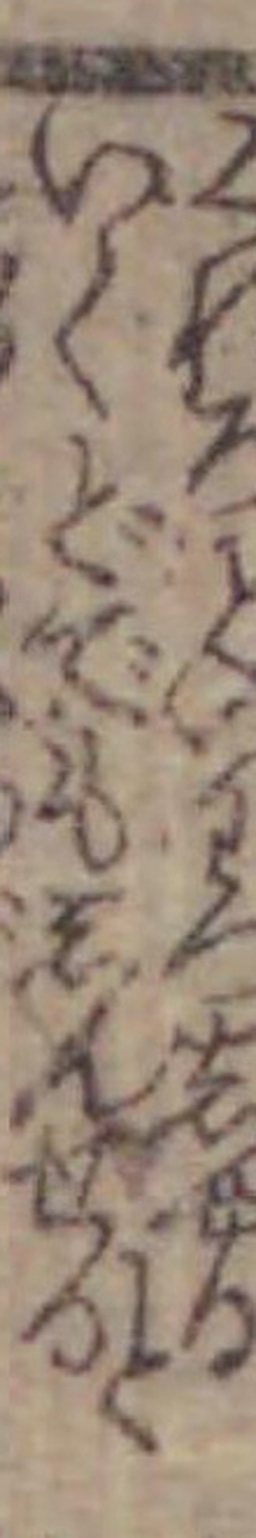いくどでもしんせる
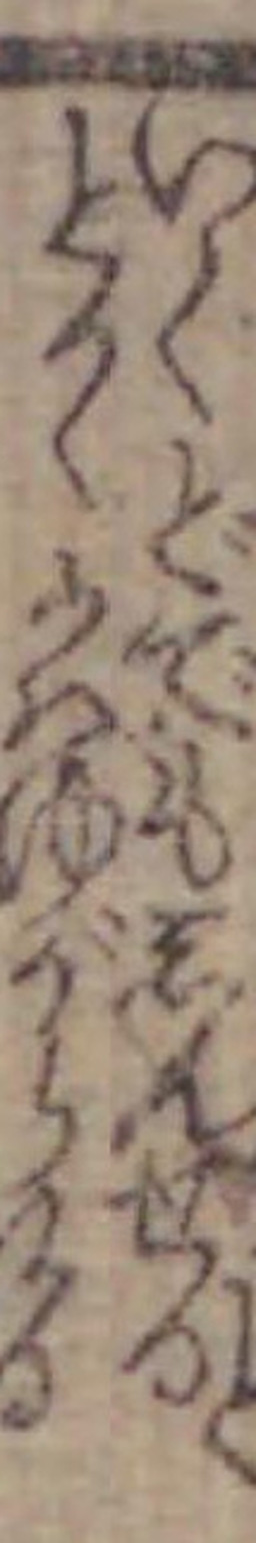とかくかはゆがられる
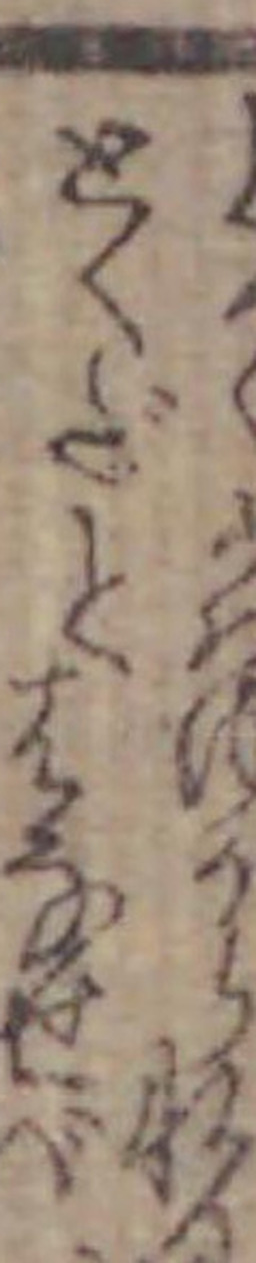とくだとはなせば
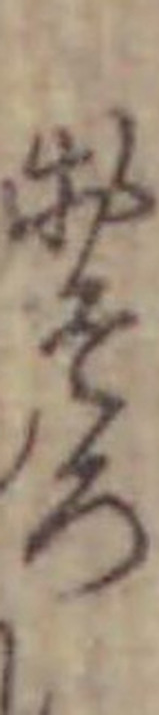おそろ
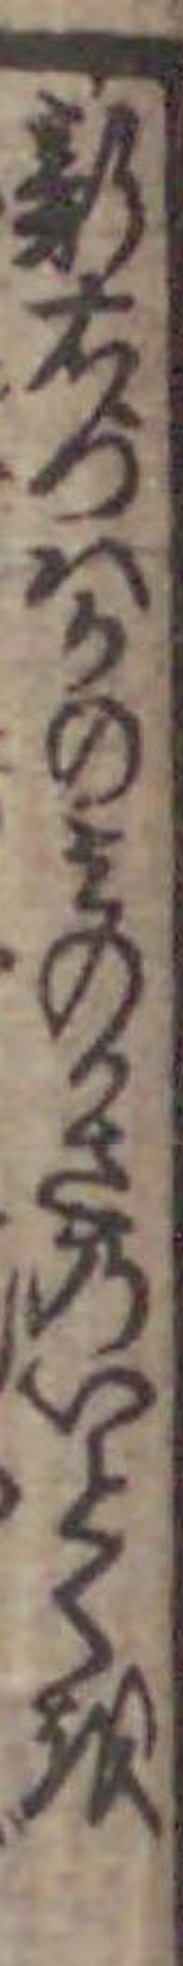新右衛門はかのみのかさのいとくを
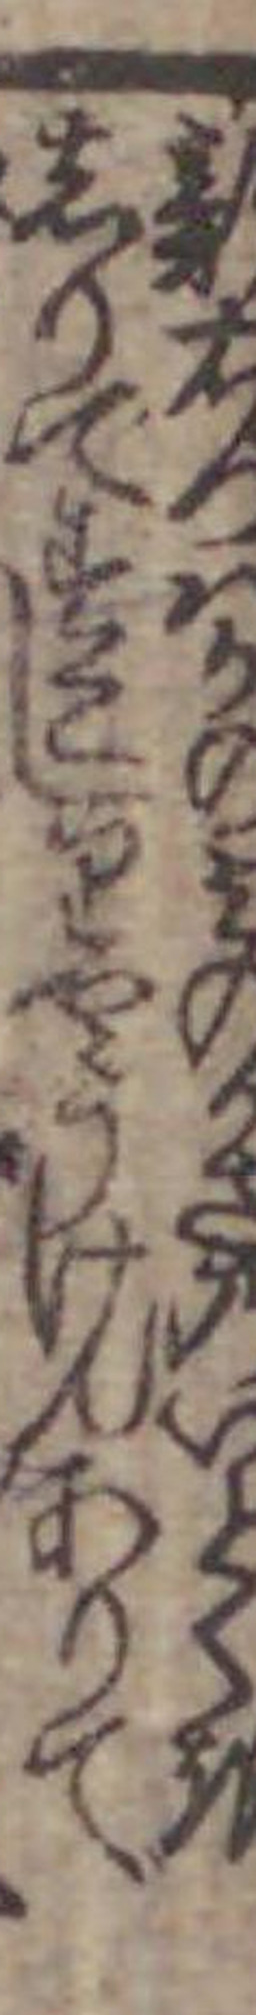しりてすこしりやうけんありて
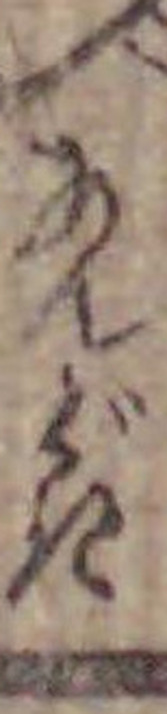なんどき
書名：即席耳学問 : 3巻
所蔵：国立国会図書館 National Diet Library, JAPAN
